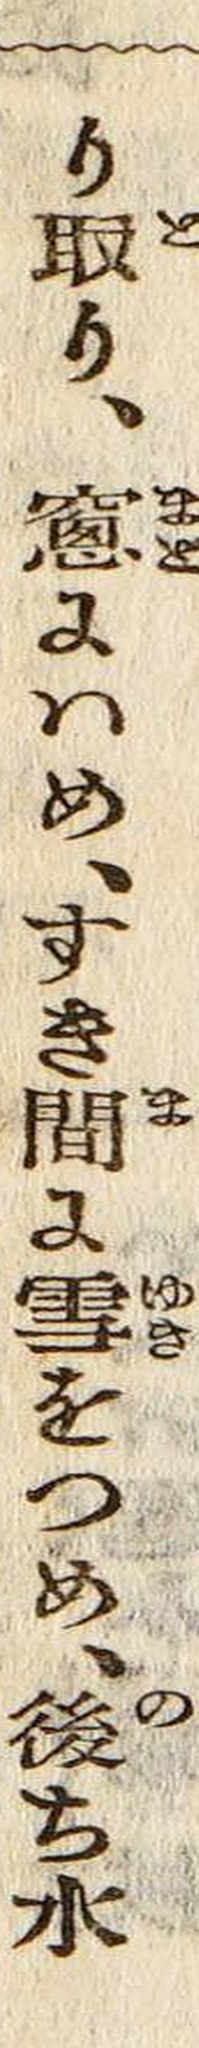り取り、窓にはめ、すき間に雪をつめ、後ち水
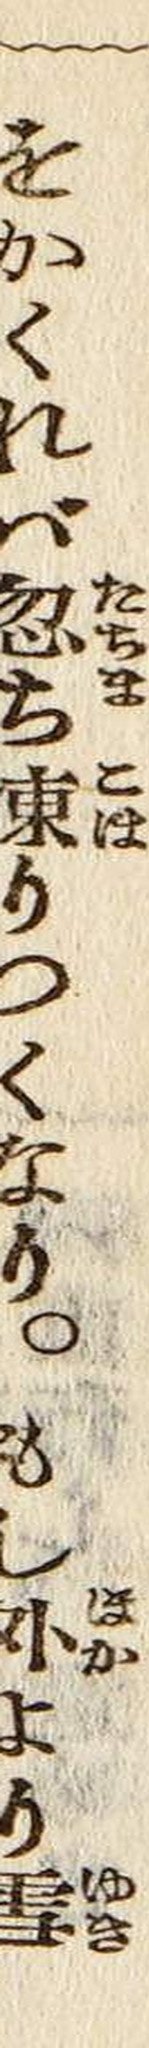をかくれば忽ち凍りつくなり。もし外より雪
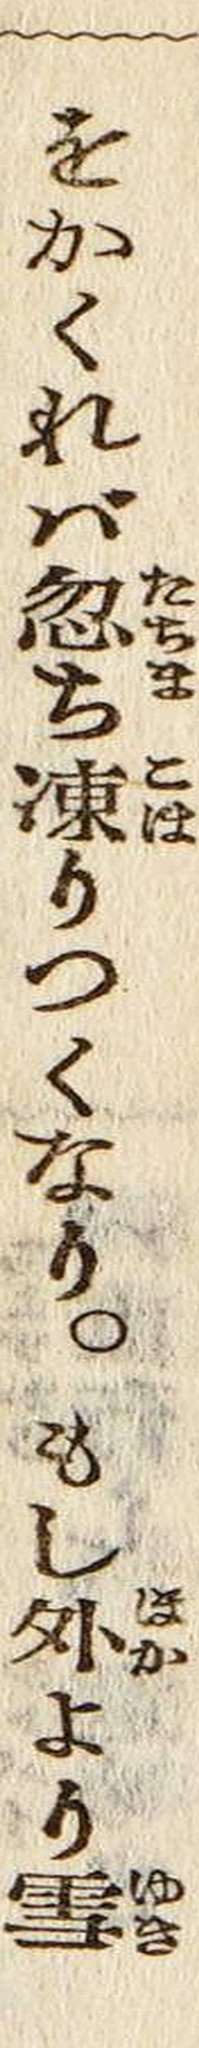をかくれば忽ち凍りつくなり。もし外より雪
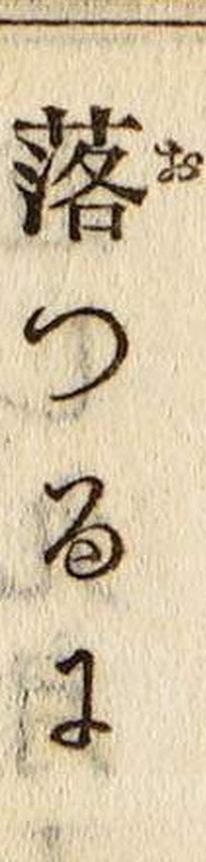落つるに
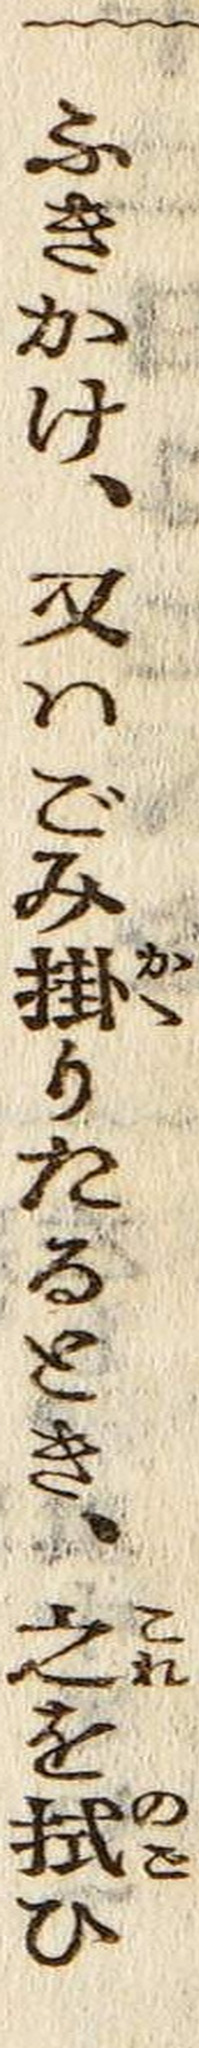ふきかけ、又はごみ掛りたるとき、之を拭ひ
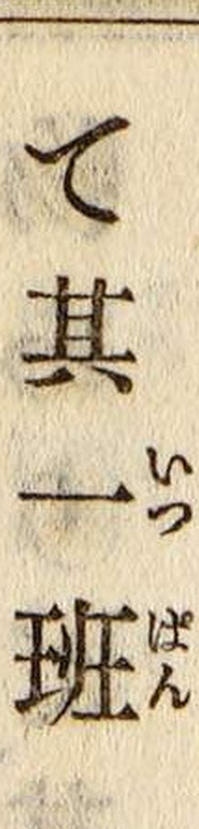て其一班
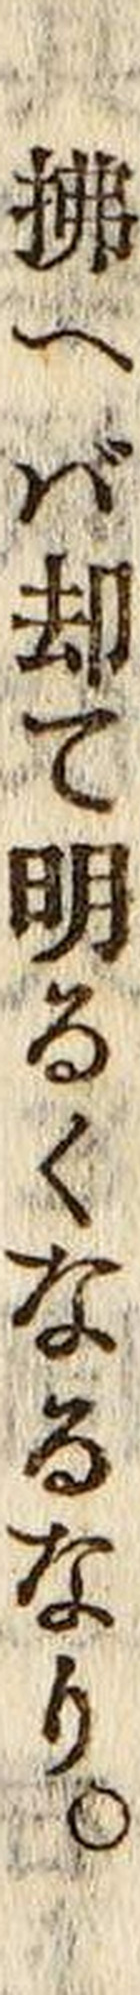払へば却て明るくなるなり。
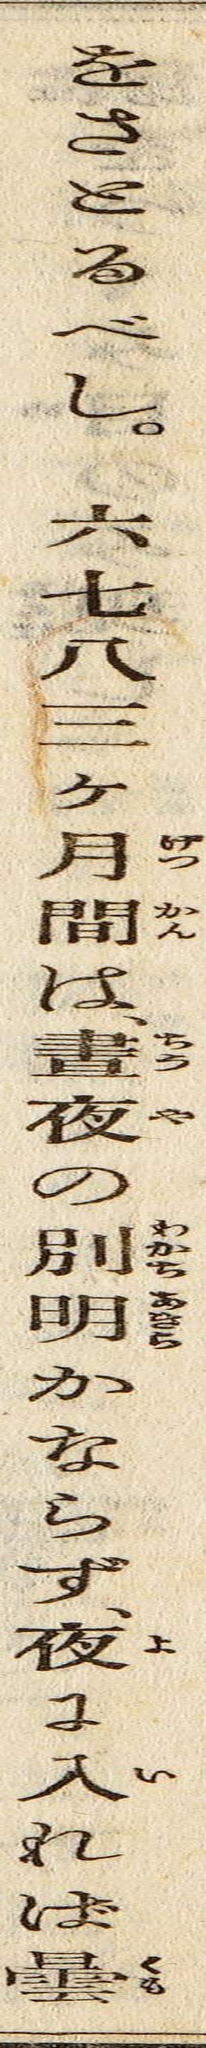をさとるべし。六七八三ヶ月間は、昼夜の別明かならず、夜に入れば雲
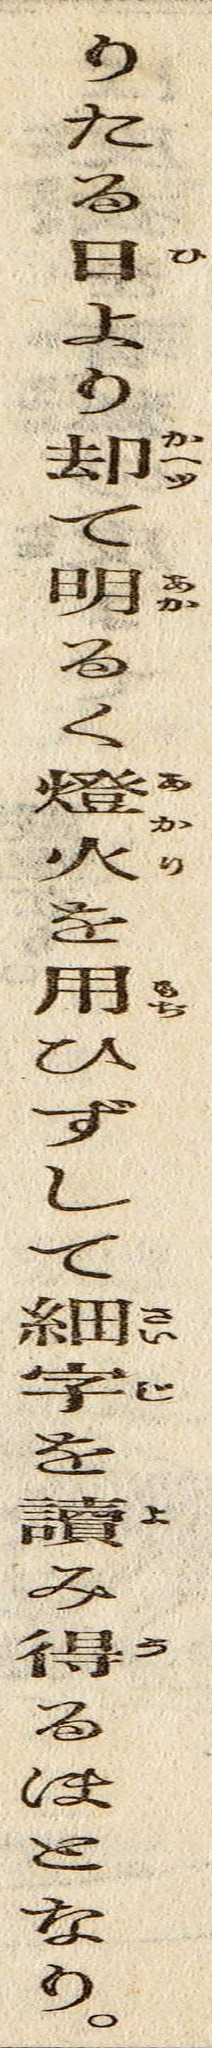りたる日より却て明るく灯火を用ひずして細字を読み得るほとなり。
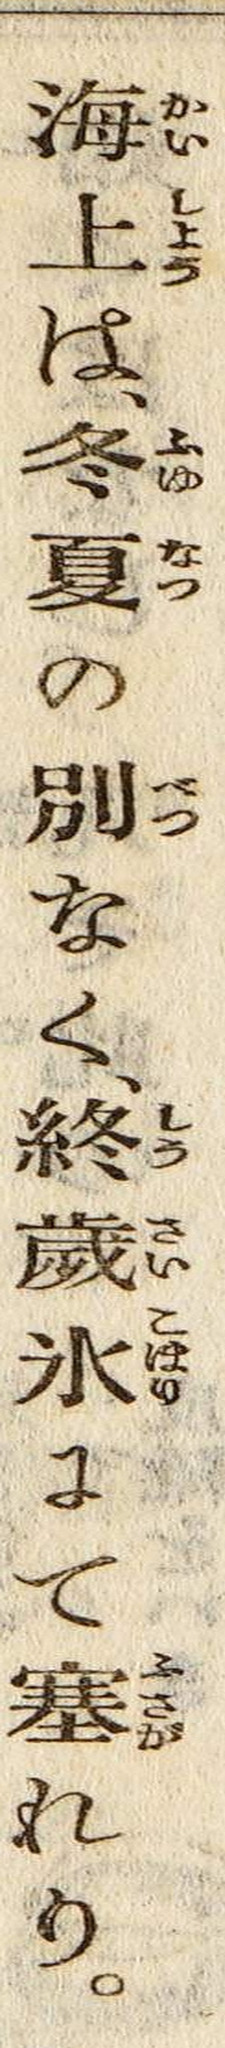海上は、冬夏の別なく、終歳氷にて塞れり。
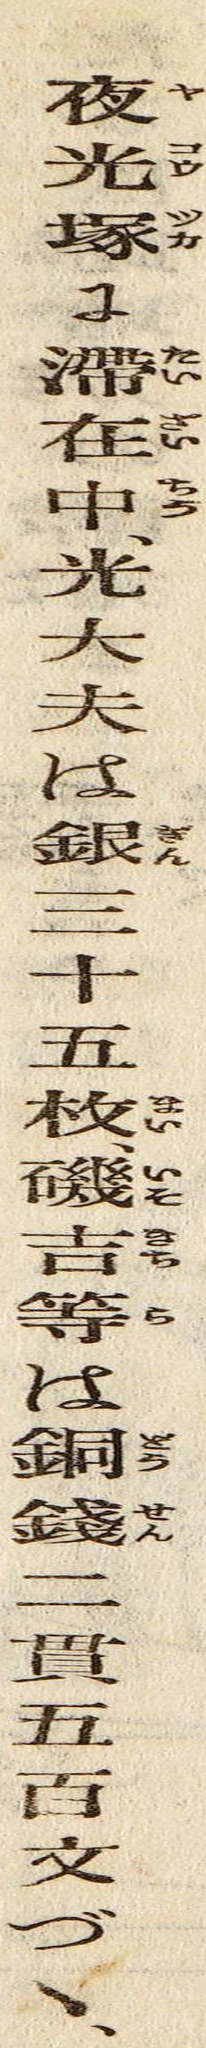夜光塚に滞在中、光大夫は銀三十五枚、磯吉等は銅銭二貫五百文づゝ、
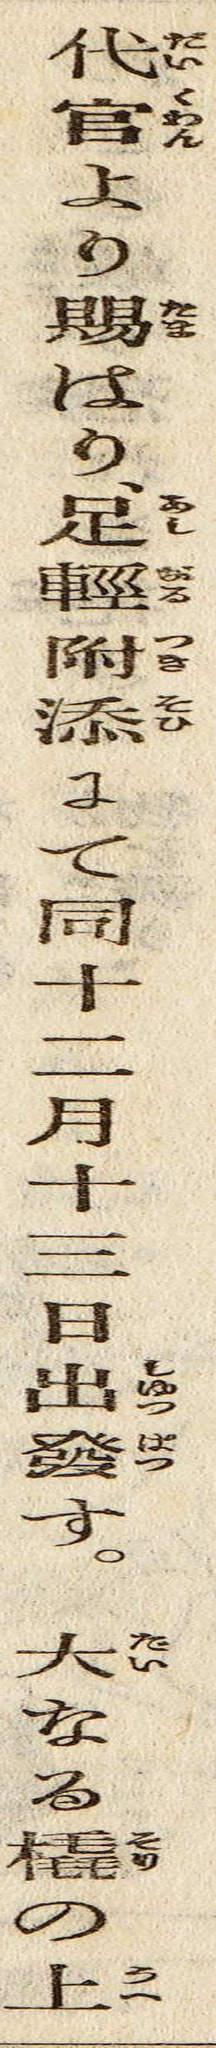代官より賜はり、足軽附添にて同十二月十三日出発す。大なる橇の上
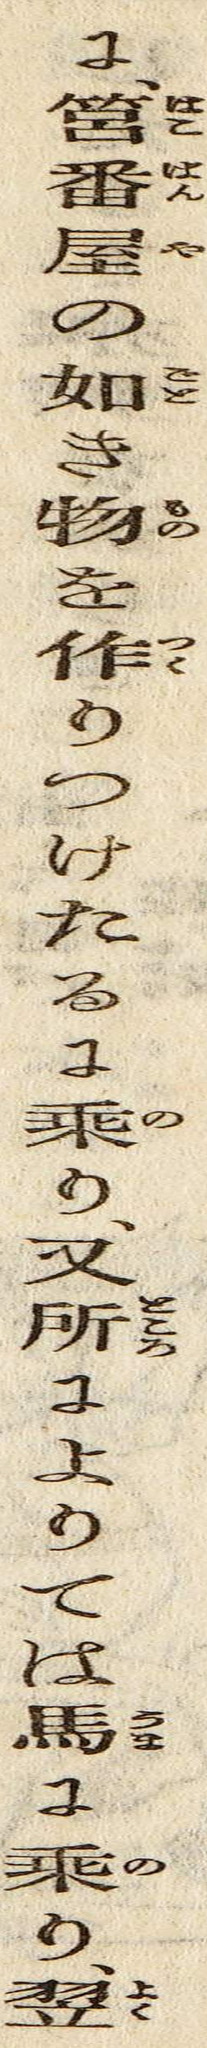に、筥番屋の如き物を作りつけたるに乗り、又所によりては馬に乗り、翌
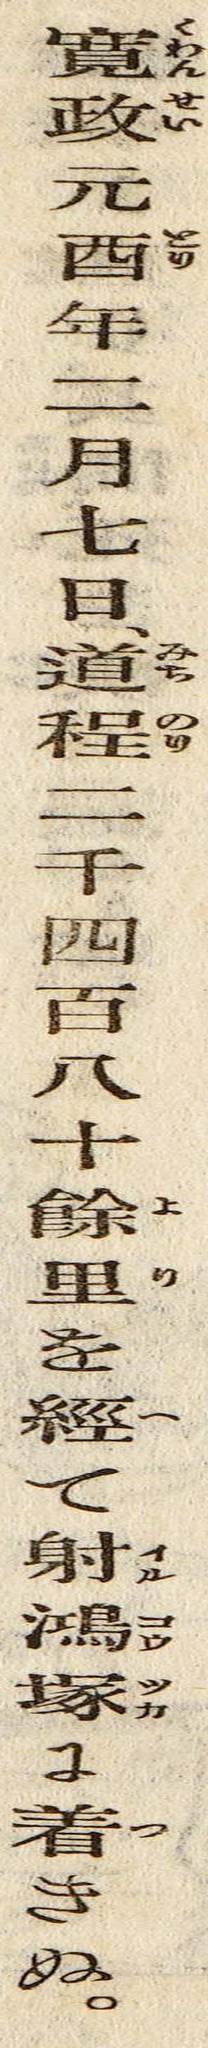寛政元酉年二月七日、道程二千四百八十余里を経て射鴻塚に着きぬ。
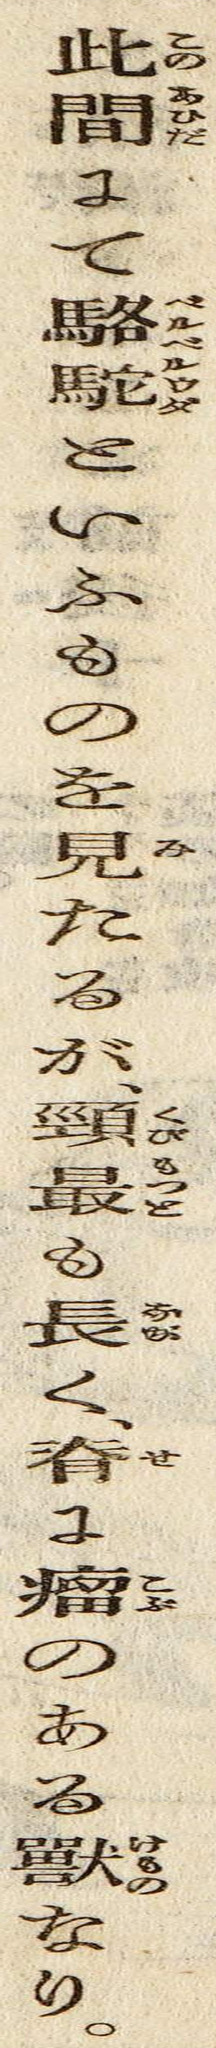此間にて駱駝といふものを見たるが、頸最も長く、背に瘤のある獣
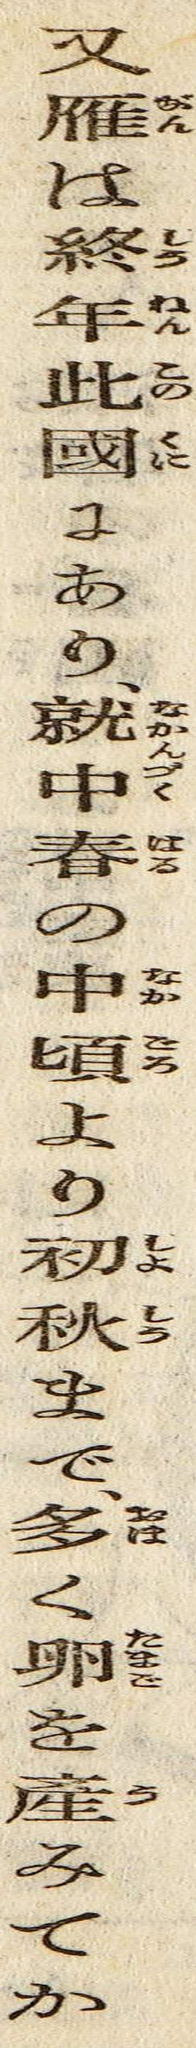又雁は終年此国にあり、就中春の中頃より初秋まで、多く卵を生みてか
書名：日本漂流譚
